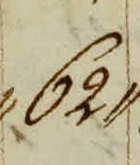62
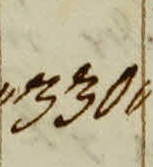330
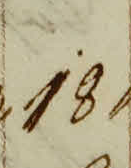18
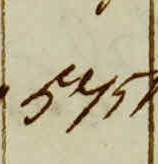575
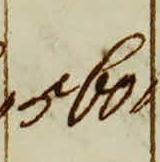560
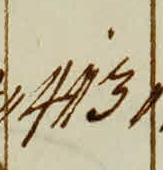413
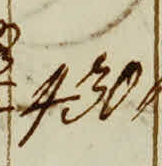430
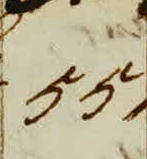55
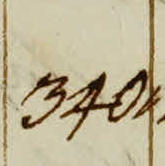340
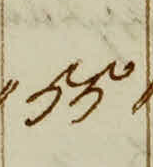55
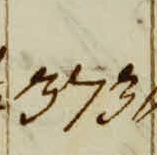373
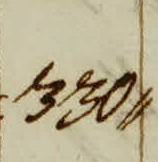330
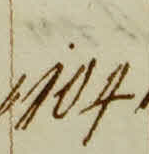104
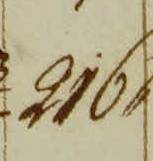216
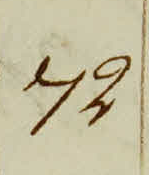72
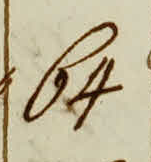64
